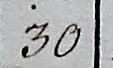30
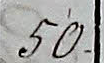50
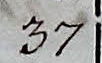37
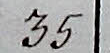35
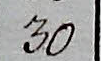30
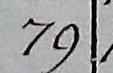79
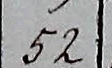52
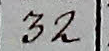32
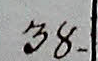38
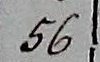56
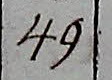49
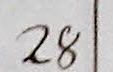28
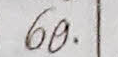60.
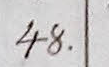48.
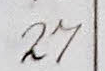27
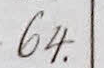64.
